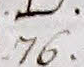76
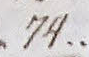74
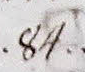84
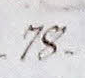78
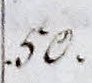50
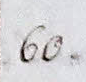60
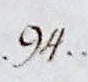94
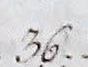36
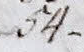54
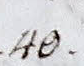40
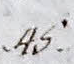45
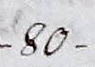80
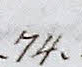74
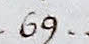69
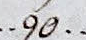90
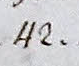42
